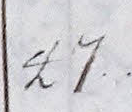47
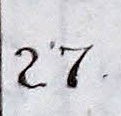27
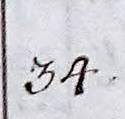34
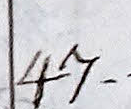47
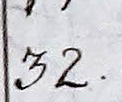32
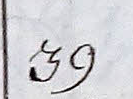39
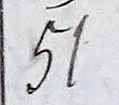51
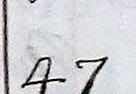47
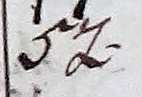52
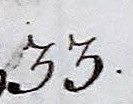33
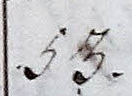53
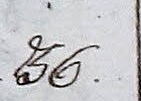36.
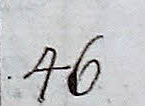46
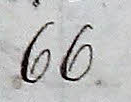66
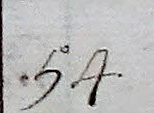54
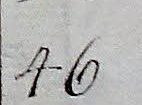46
